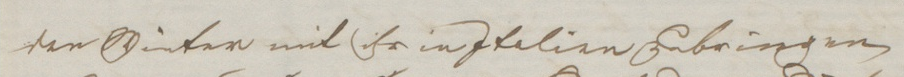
den Winter mit ihr in Italien zubringen
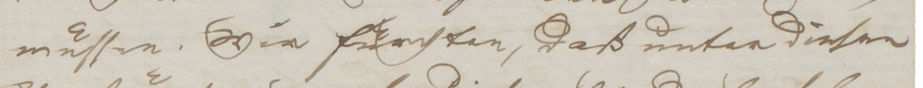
müssen. Wir fürchten, daß unter diesen
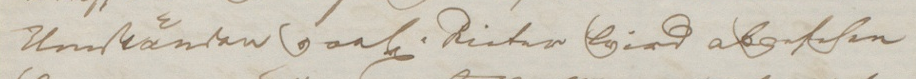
Umständen von H. Rieter wird abgesehen
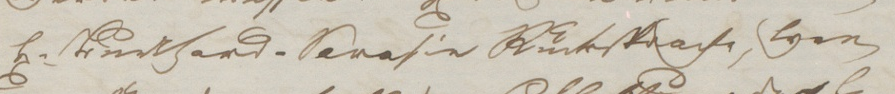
H. Burkhard-Sarasin Rücksprache, wen
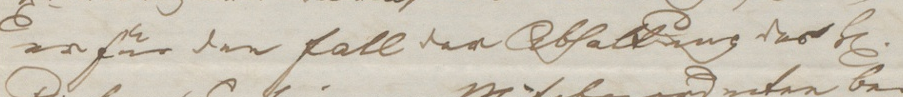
er für den Fall der Abhaltung des H.
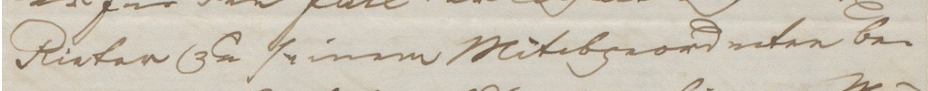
Rieter zu seinem Mitabgeordneten be-
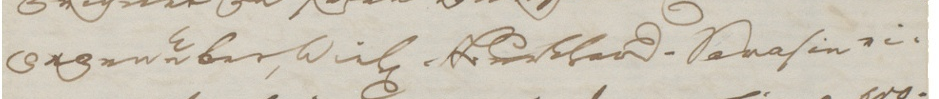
gegenüber, wie H. Burkhard-Sarasin ei-
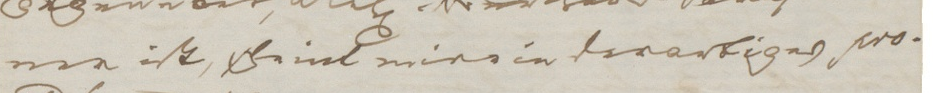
ner ist, scheint mir ein derartiges pro-
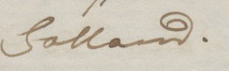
Holland.
